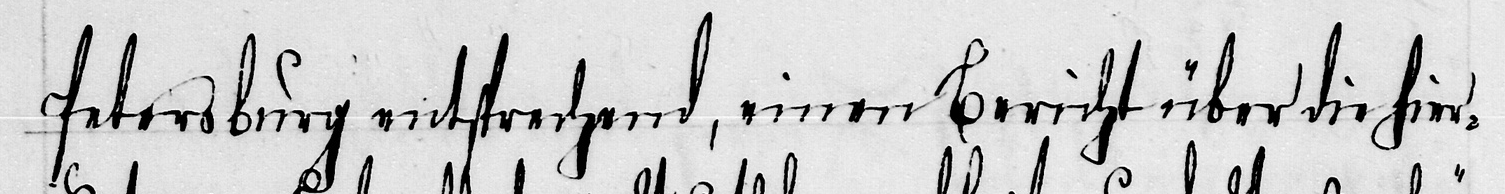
Petersburg entsprechend, einen Bericht über die hie¬
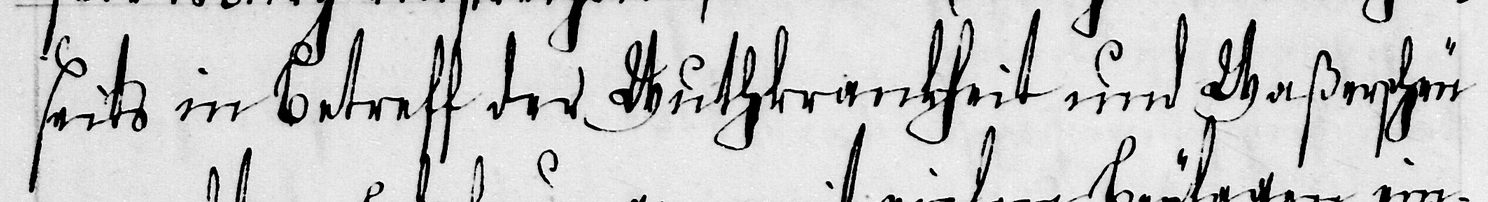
rseits in Betreff der Wuthkrankheit und Waßerscheu
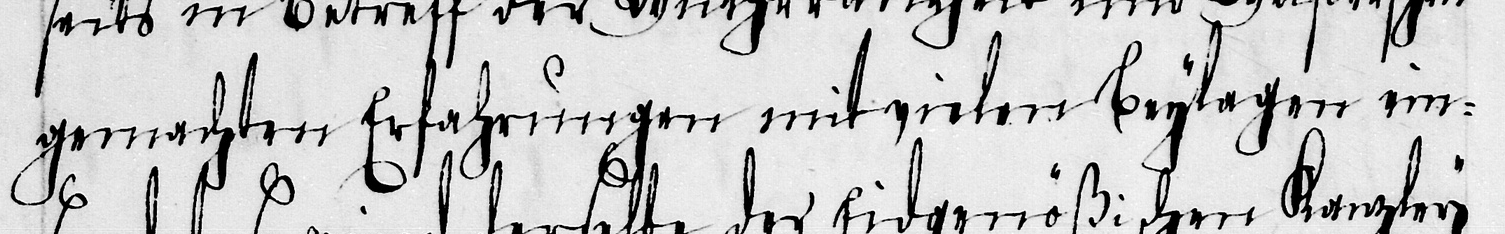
gemachten Erfahrungen mit vielen Beylagen ein¬
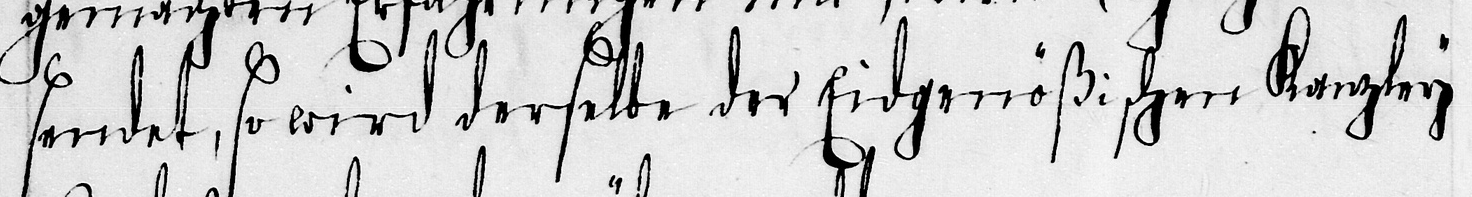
sendet, so wird derselbe der Eidgenößischen Kanzley
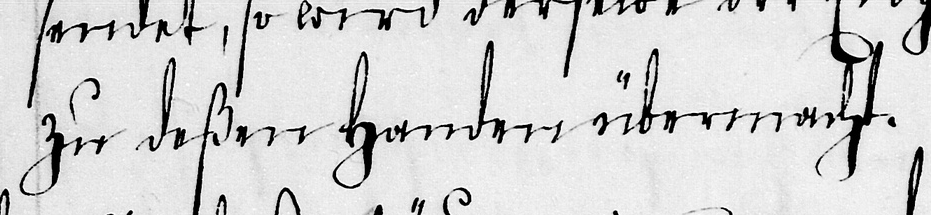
zu deßen Handen übermacht.
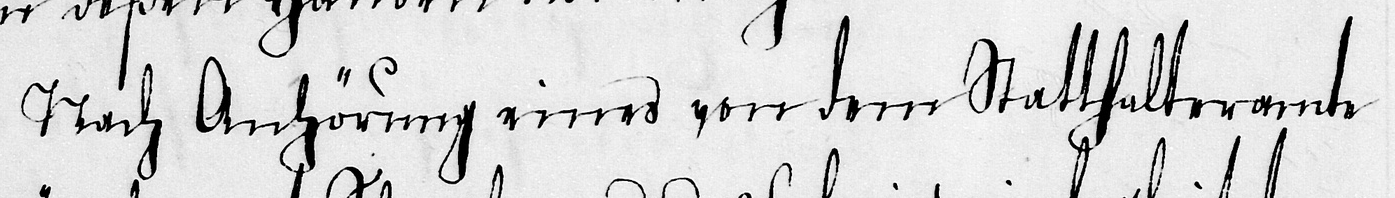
Nach Anhörung eines von dem Statthalteramte
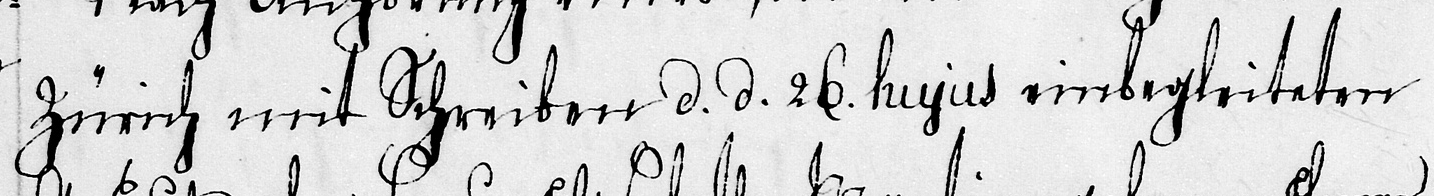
Zürich mit Schreiben d. d. 26. hujus einbegleiteten
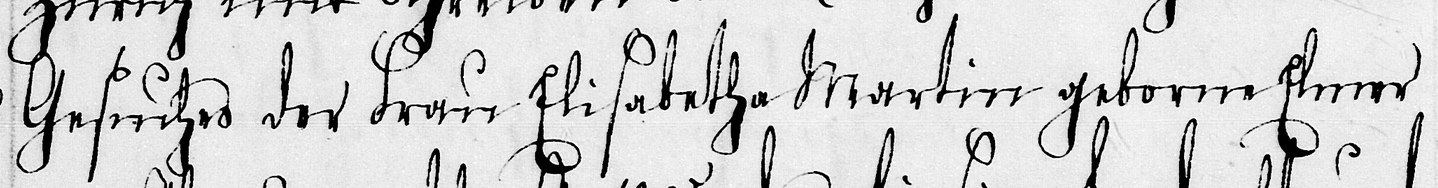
Gesuches der Frau Elisabetha Martin geborne Elmer
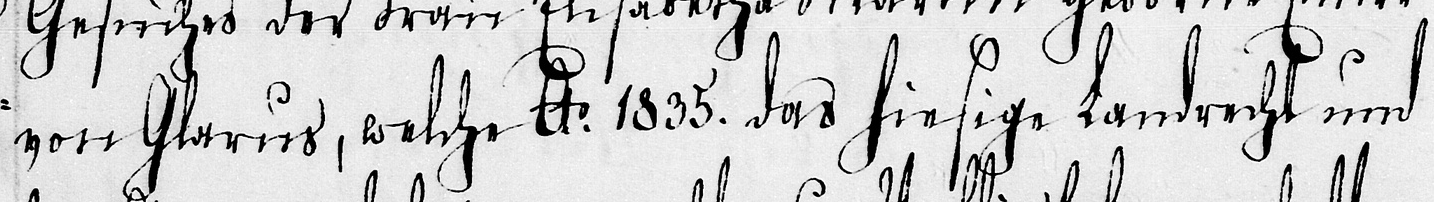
von Glarus, welche Ao 1835. das hiesige Landrecht und
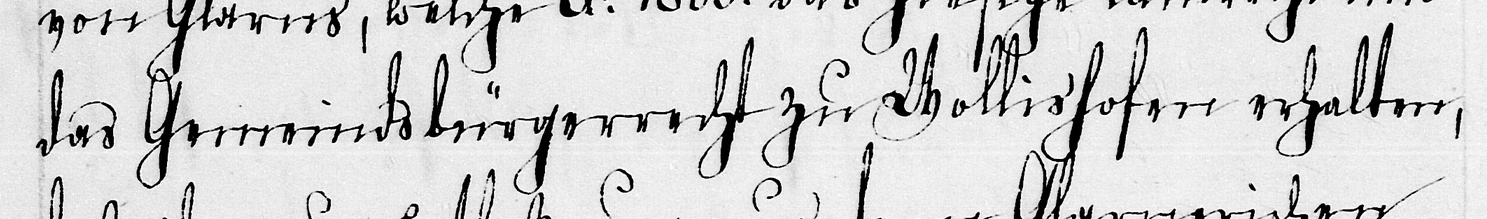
des Gemeindsbürgerrecht zu Wollishofen erhalten,
